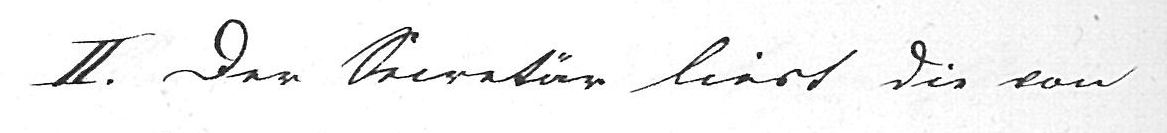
II. Der Secretär liest die von
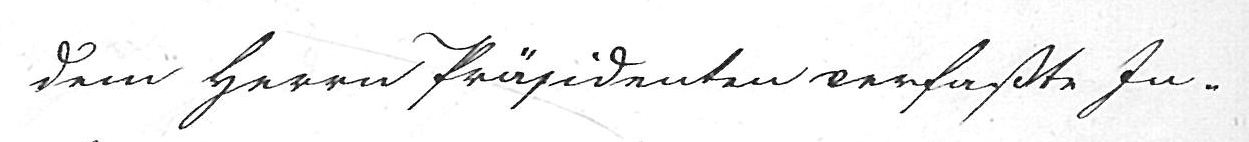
dem Herrn Präsidenten verfaßte In-
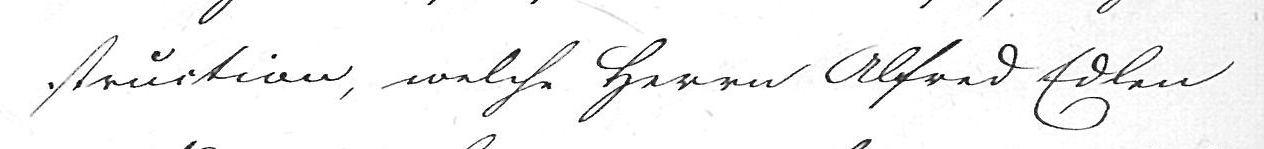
struction, welche Herrn Alfred Edlen
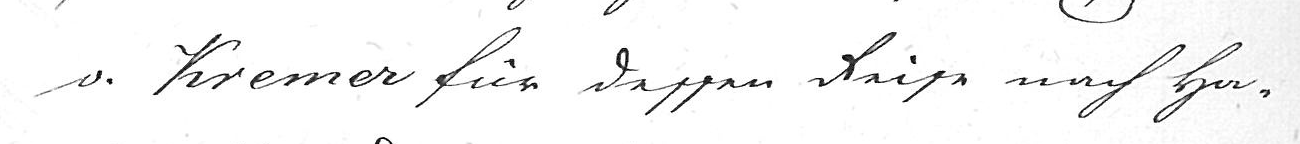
v. Kremer für dessen Reise nach Ha-
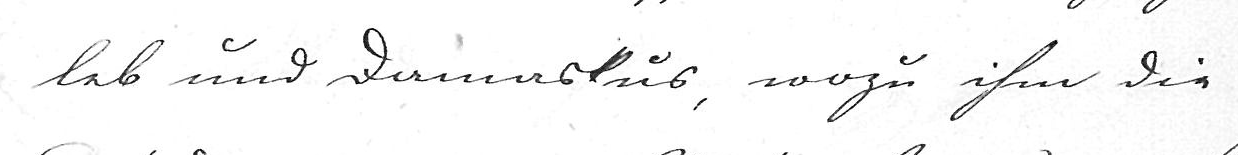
leb und Damaskus, wozu ihm die
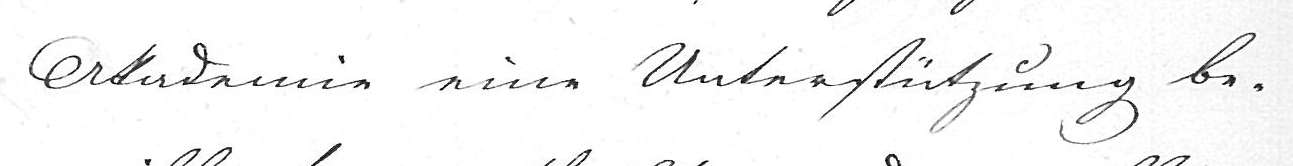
Akademie eine Unterstützung be-
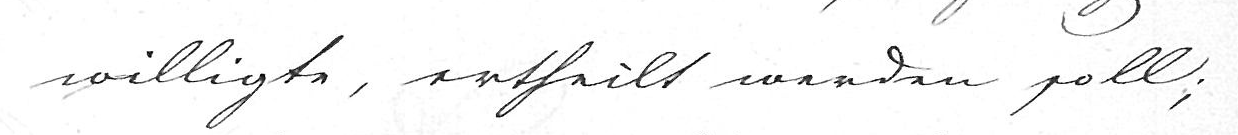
willigte, ertheilt werden soll;
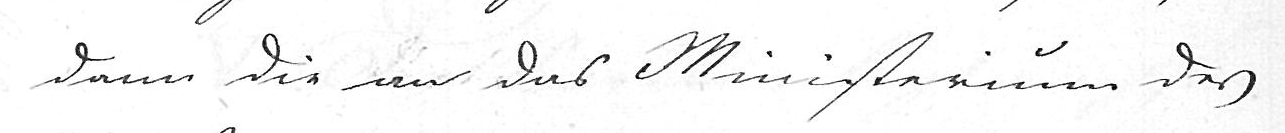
dann die an das Ministerium des
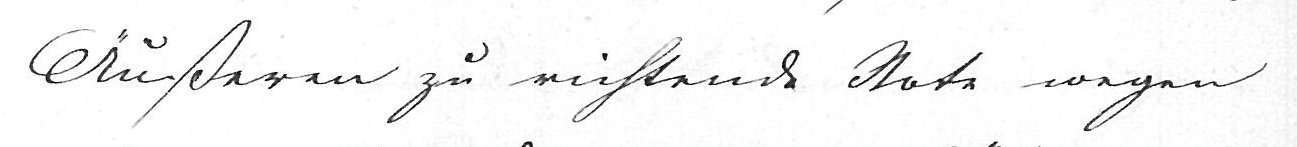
Äußeren zu richtende Note wegen
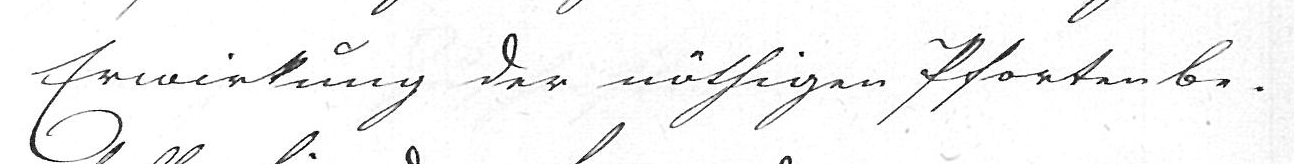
Erwirkung der nöthigen Pfortenbe-
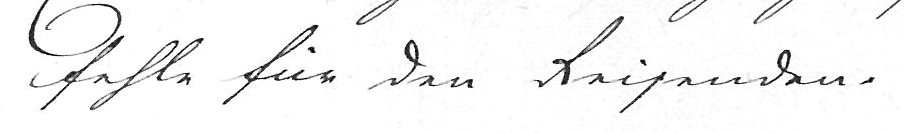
fehle für den Reisenden.
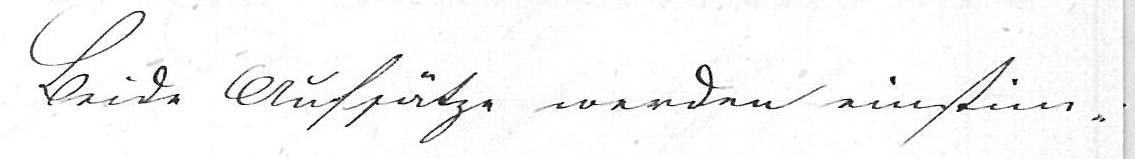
Beide Aufsätze werden einstim-
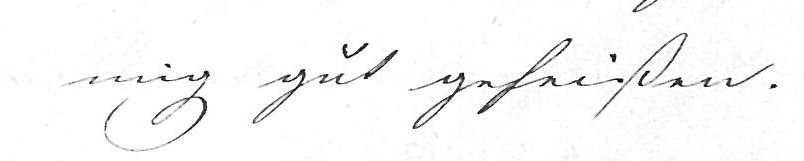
mig und gut geheißen.
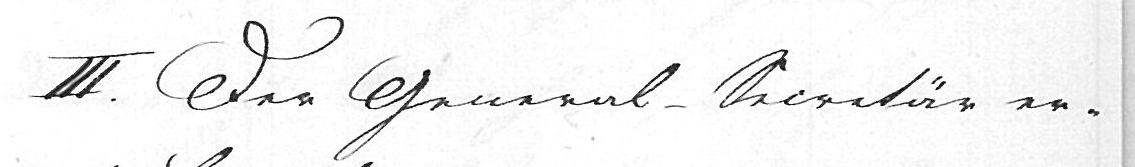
III. Der General-Secretär er-
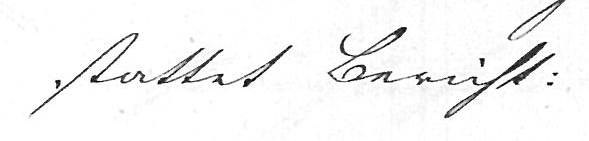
stattet Bericht:
